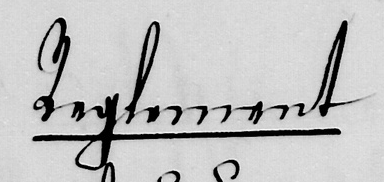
Reglement
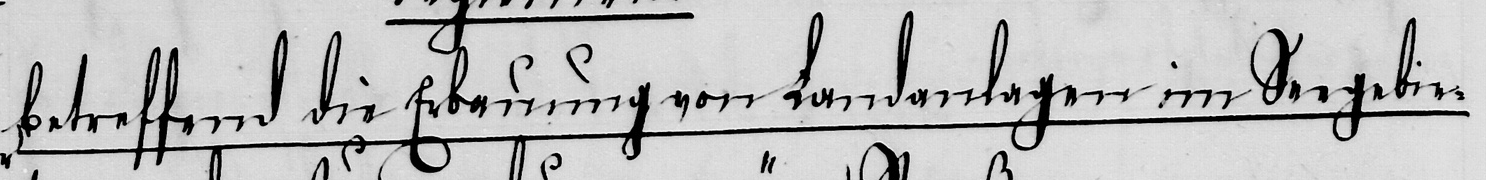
betreffend die Erbauung von Landanlagen im Seegebie¬
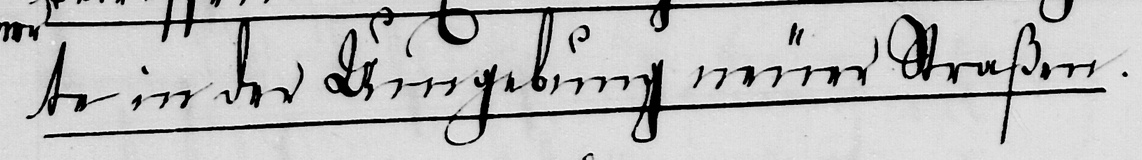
te in der Umgebung neuer Straßen.
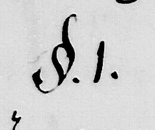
§. 1.
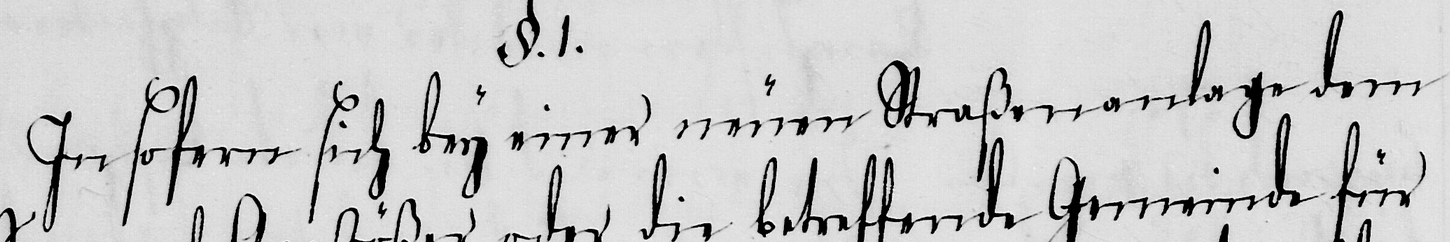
Insofern sich bey einer neuen Straßenanlage dem
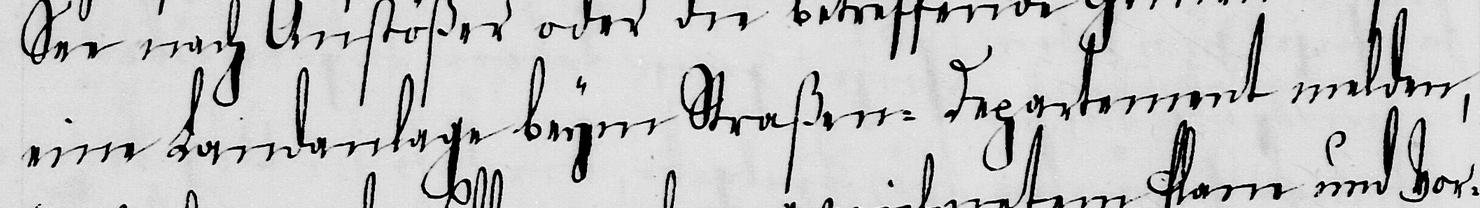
eine Landanlage beym Straßen-Departement melden,
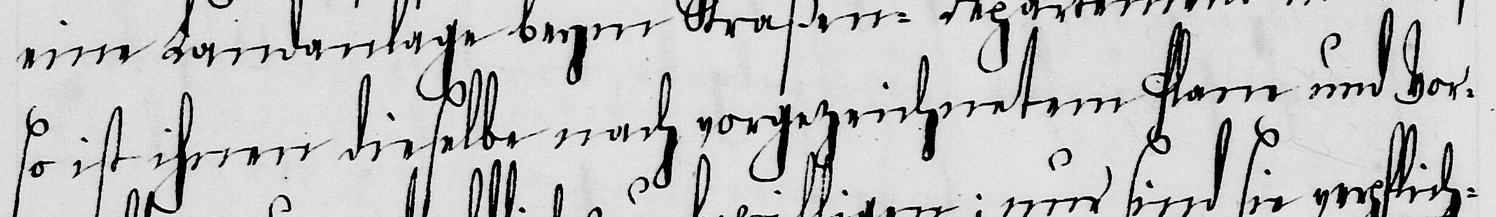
so ist ihnen dieselbe nach vorgezeichnetem Plane und Vor¬
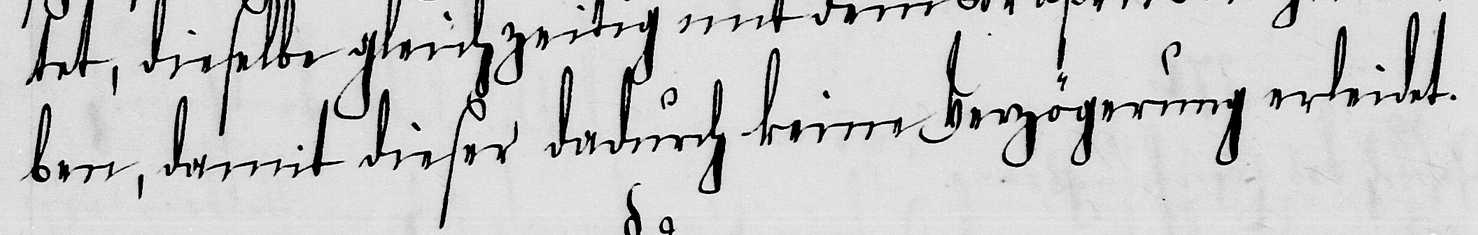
ben, damit dieser dadurch keine Verzögerung erleidet.
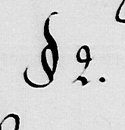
§ 2.
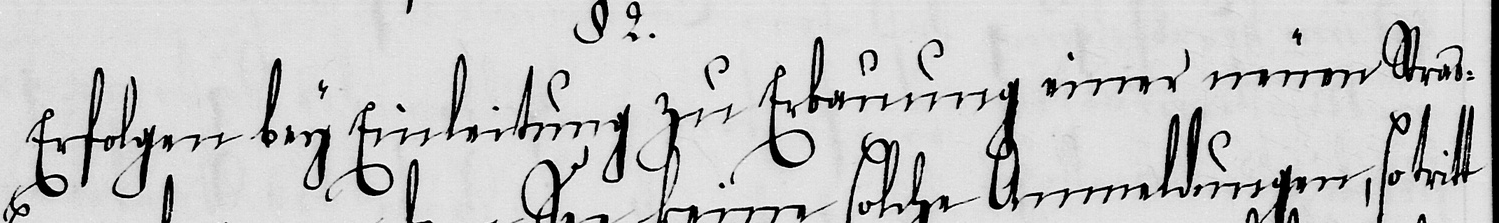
Erfolgen bey Einleitung zu Erbauung einer neuen Stra¬
